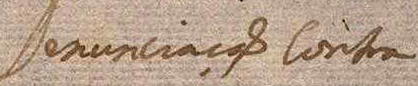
Denunciaçaõ Contra
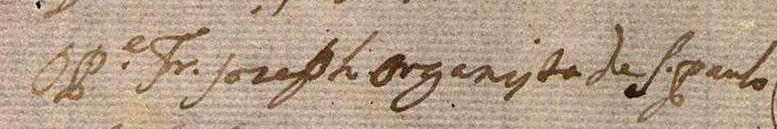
O P.e Fr. Jozeph organista de S. paulo
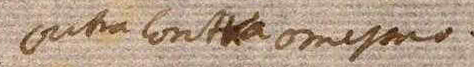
outra contra o mesmo.
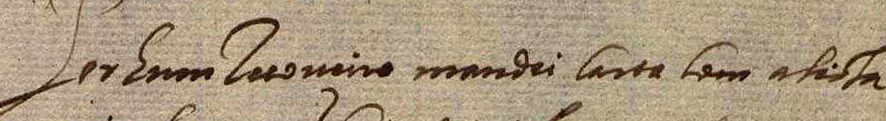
Por hum Recoueiro mandei carta com a lista
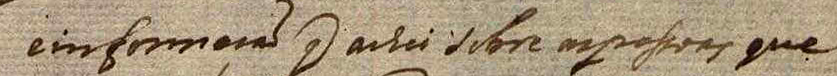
e informaçaõ q̄ achei sobre as pessoas que
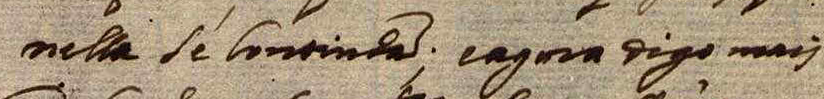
nella se Continhā; e agora digo mais
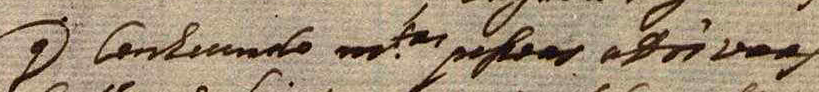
q̄ Conhecendo m.tas pessoas a Dos̄ vaas
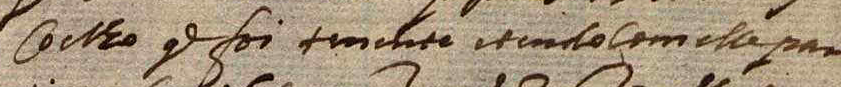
Coelho q̄ foi tenente e tendo com elle par
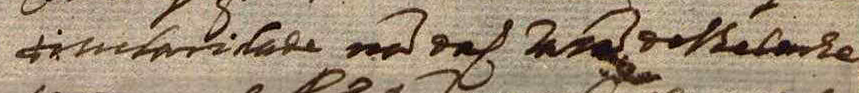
ticularidade naõ daꝭ Razaõ de lhe conhe
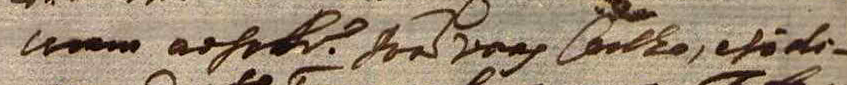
cerem ao sobr.o Ioaõ vaas Coelho, e só di
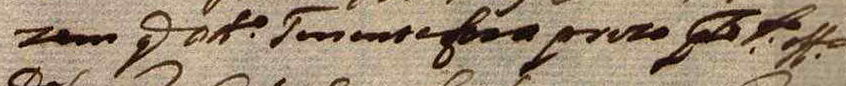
zem q̄ o d̄.o Tenente fora prezo plo s.o off.o
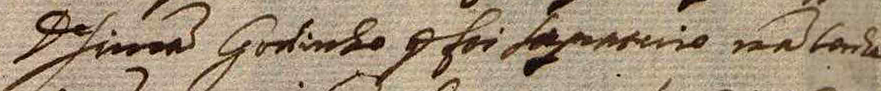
Do Simaõ Godinho q̄ foi sapateiro nā conhe
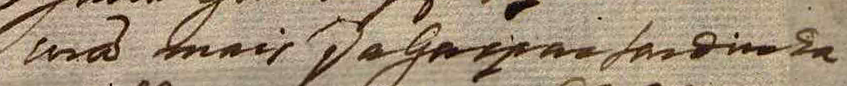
ceraõ mais q̄ a Gaspar sardinha
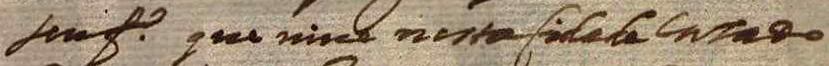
seu f.o que uiue nesta Cidade cazado
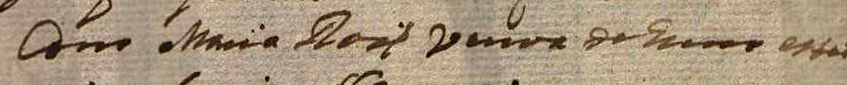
Com Maria Roiz̄ veuva de hum estei
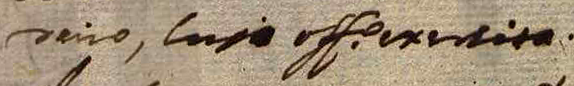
reiro, cuio off.o exercita.
